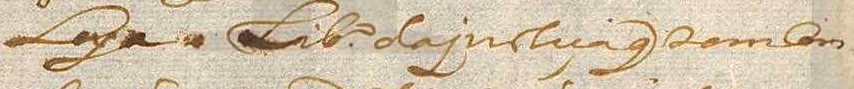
Leya o Lib.o da justiça q̄ tem con
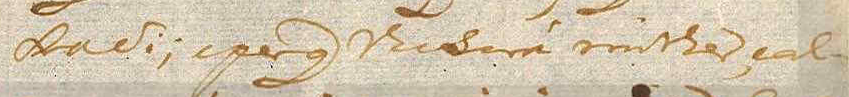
tra si; e porq̄ lhe será melhor, e al
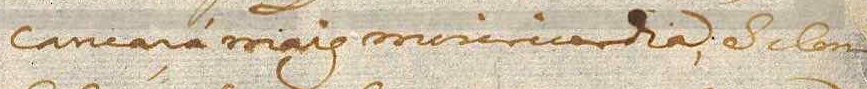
cançará mais misericordia, Se con
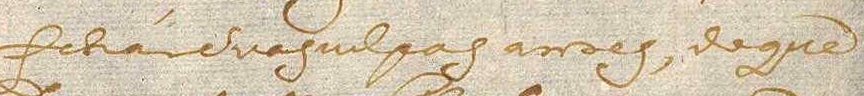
fessar suas culpas antes, do que
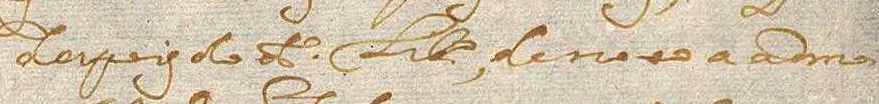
despois do d̄.o Lib.o, de novo a admo
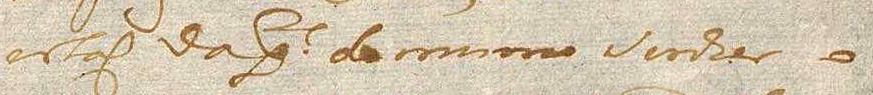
estaꝭ da p.te do mesmo senhor o
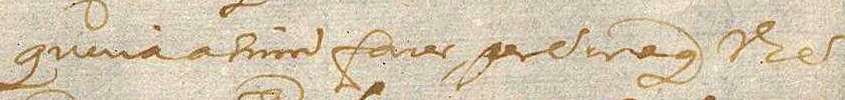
queria assim fazer, por ser a q̄ lhe
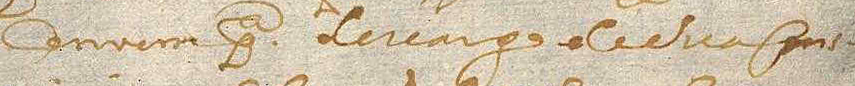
Convem p.a descargo de Sua Cons
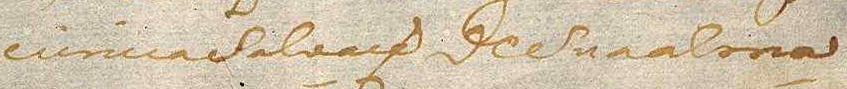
ciencia Salvaçaõ de Sua alma
